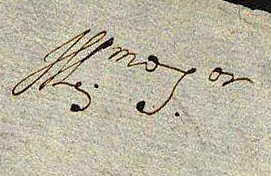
Ill.mo S.or
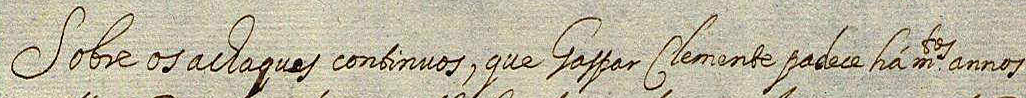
Sobre os achaques continuos, que Gaspar Clemente padece há mtos. annos
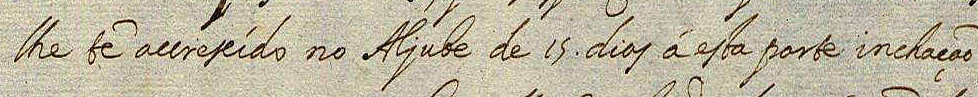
lhe tē accrescido no Aljube de 15. dias á esta parte inchação
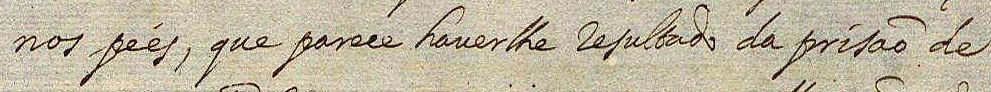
nos peés, que parece hauerlhe Resultado da prisão de
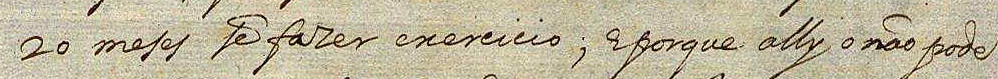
20 meses sē fazer exercicio; E porque ally o não pode
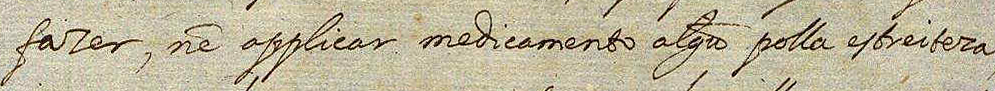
fazer, nē applicar medicamento algū polla estreiteza,
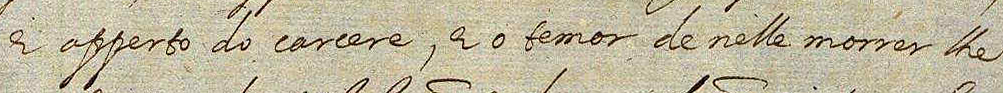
E apperto do carcere, E o temor de nelle morrer lhe
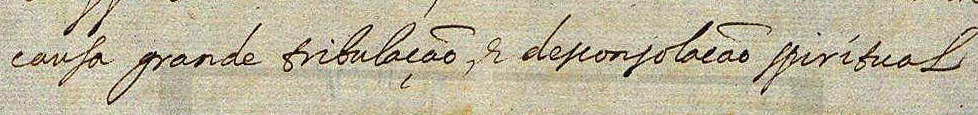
causa grande tribulaçaõ, E desconsolação spirituaL
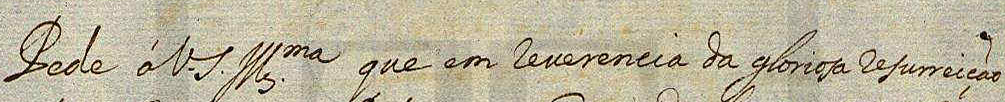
Pede á V. S. Ills.ma que em Reuerencia da gloriosa Resurreição
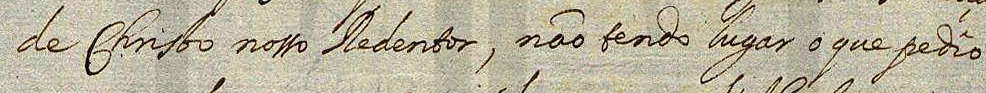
de Christo nosso Redentor, não tendo lugar o que pedio
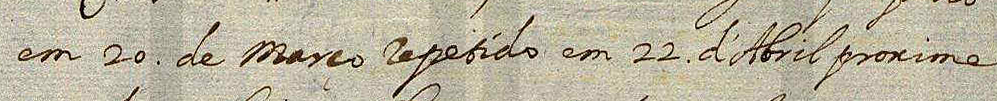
em 20. de Março Repetido em 22. d'Abril proxime
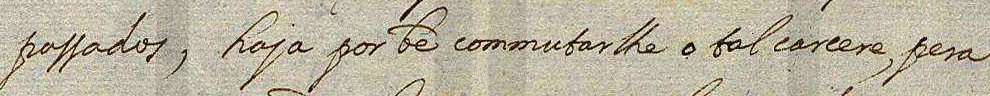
passados, haja por bē commutarlhe o tal carcere, pera
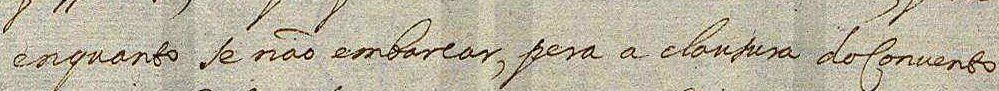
enquanto se naõ embarcar, pera a clausura do Conuento
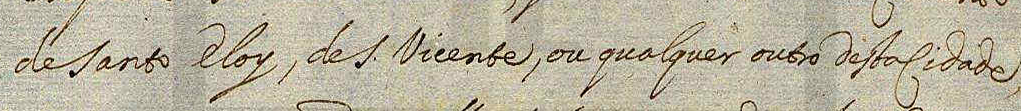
de santo eloy, de s. Vicente, ou qualquer outro desta Cidade,
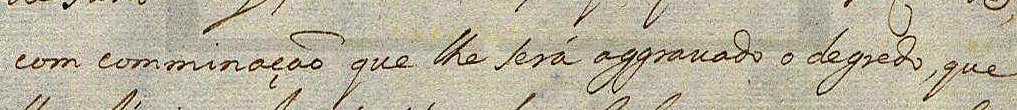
com comminaçaõ que lhe será aggrauado o degredo, que
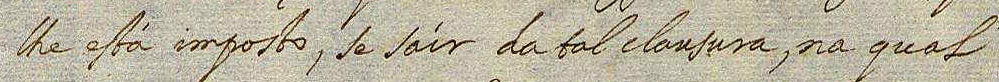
lhe está imposto, se sair da tal clausura, na qual
